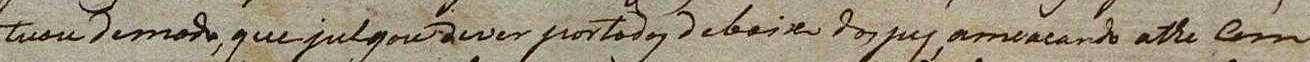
tuou de modo, que julgou dever por todos debaixo dos pes, ameacando athe com
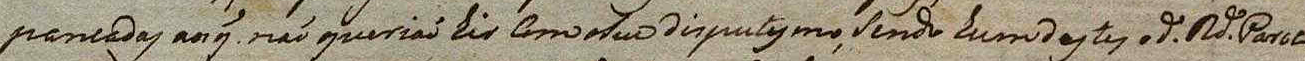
pancadas aos q̄ naõ queriaõ hir Com o seu disputismo, sendo hum destes o d.o Rd.o Paroco
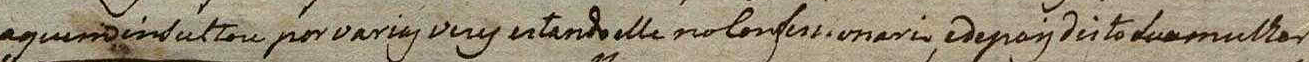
a quem insultou por varias vezes estando elle no Confessionario, e depois disto sua mulher
